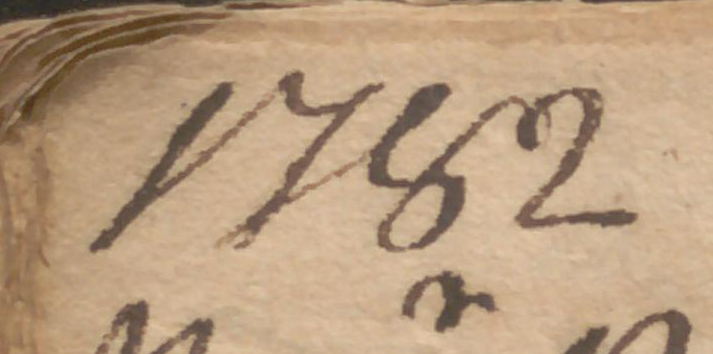1782
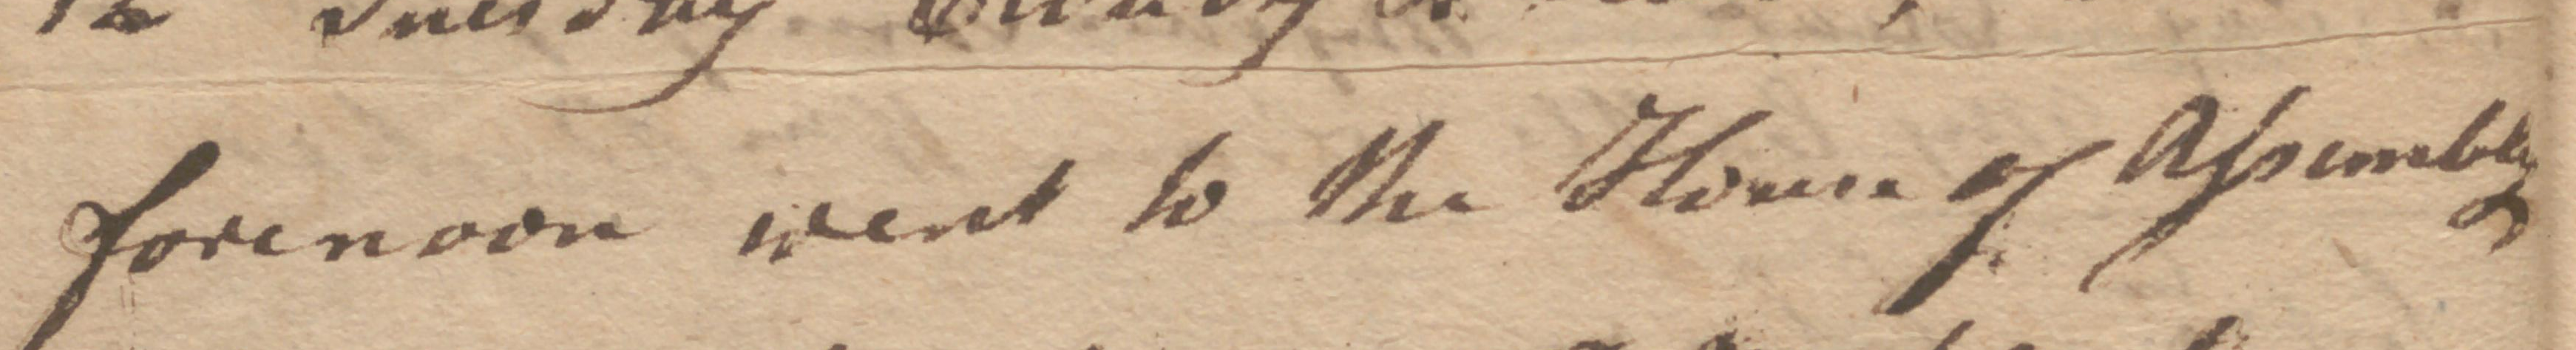forenoon went to the House of Assembly
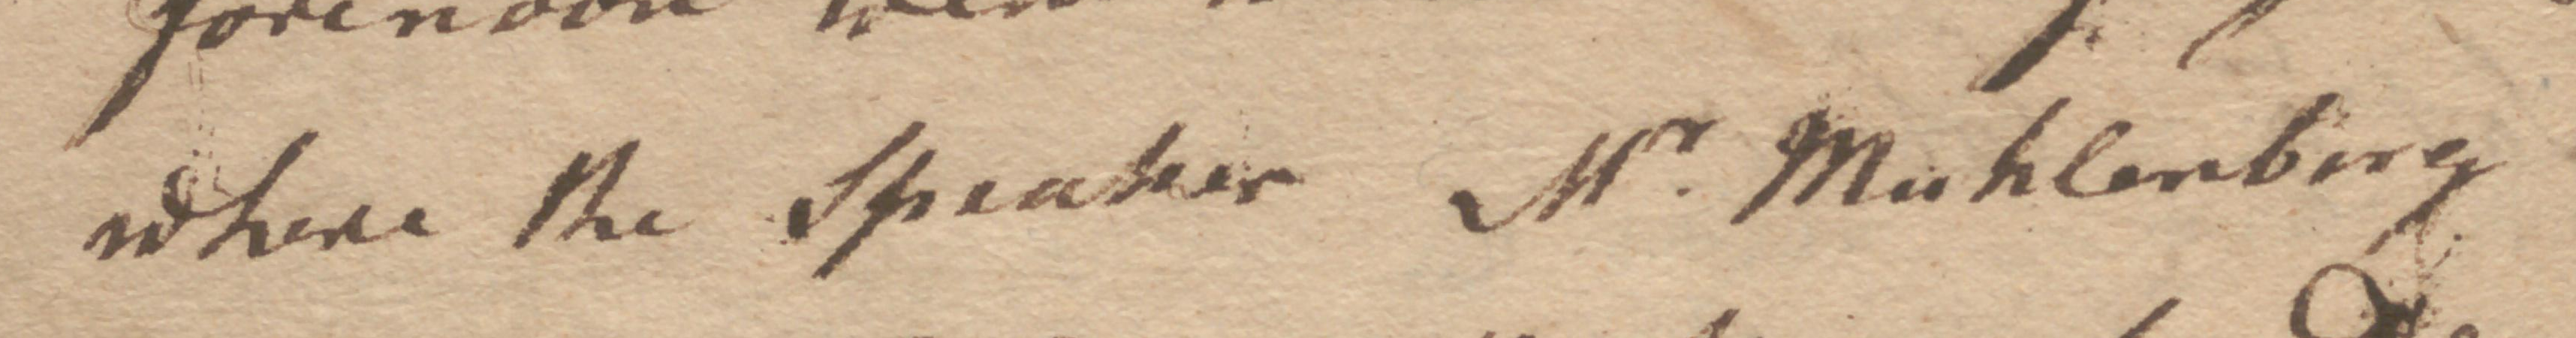where the Speaker M^r. Muhlenberg
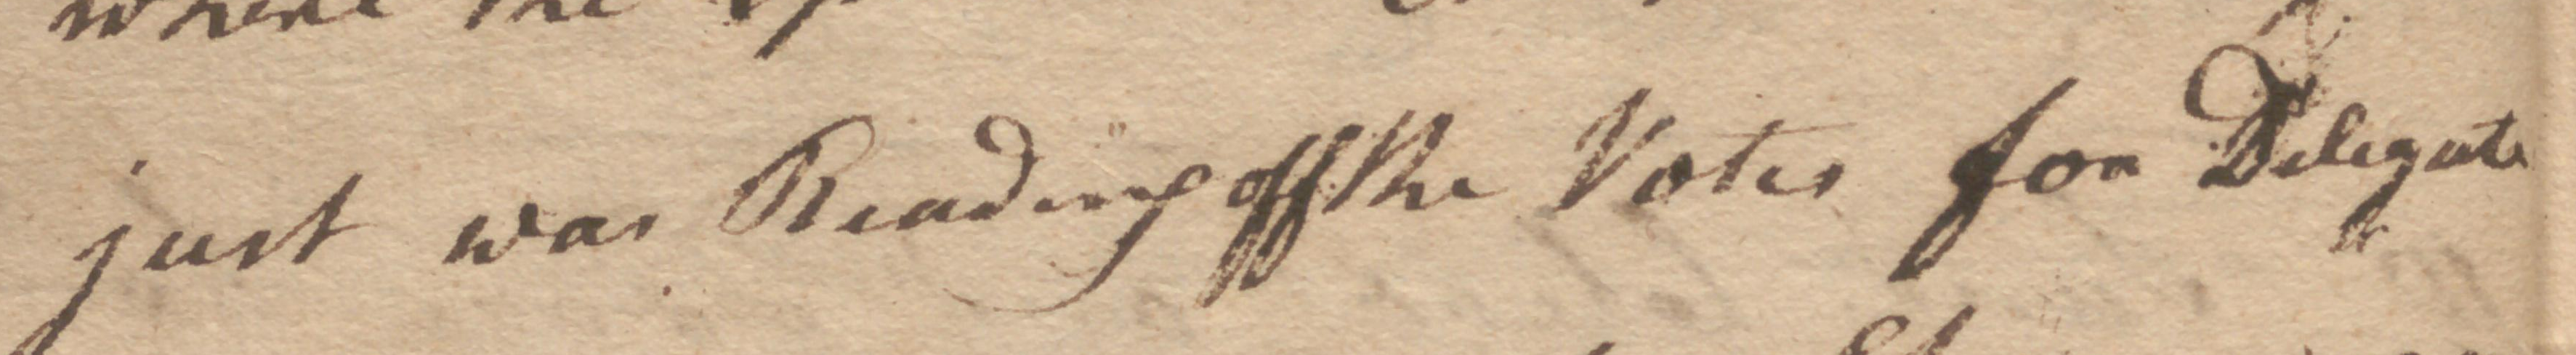just was Reading of the Votes for Delegate
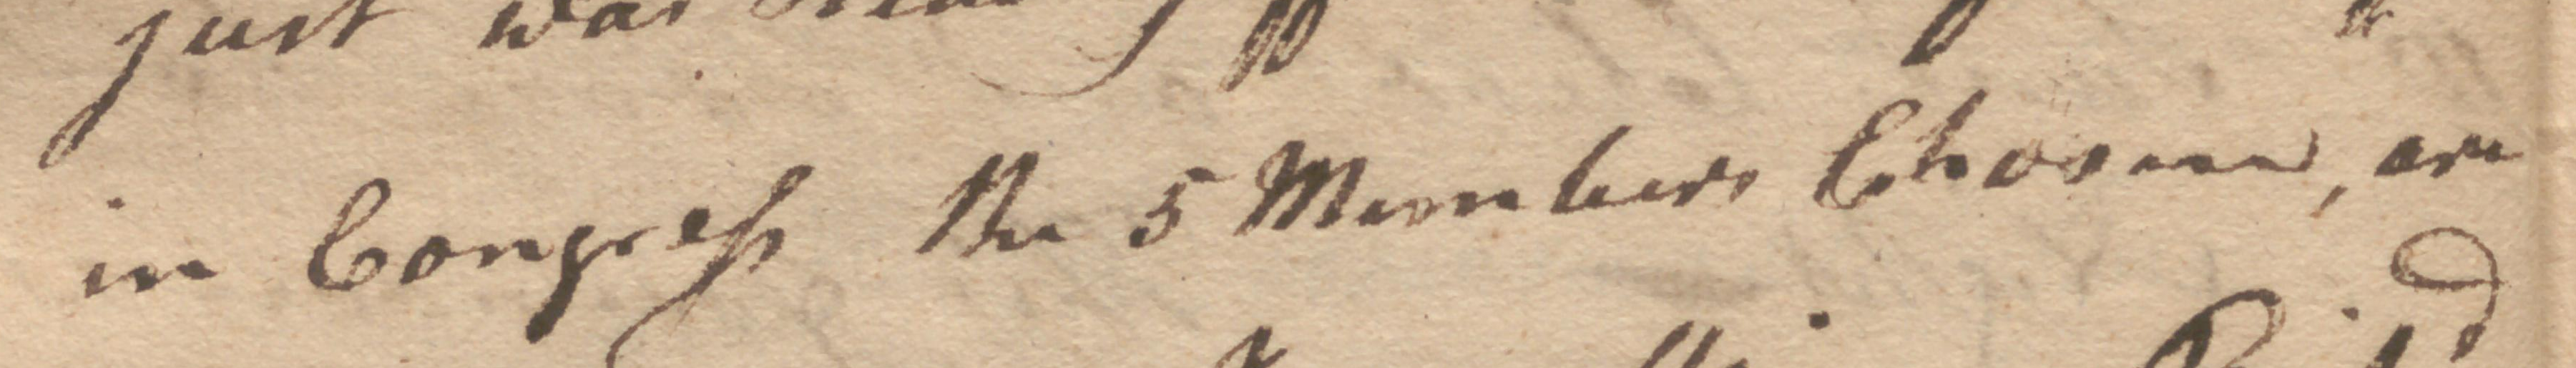in Congress the 5 Members Chosen are
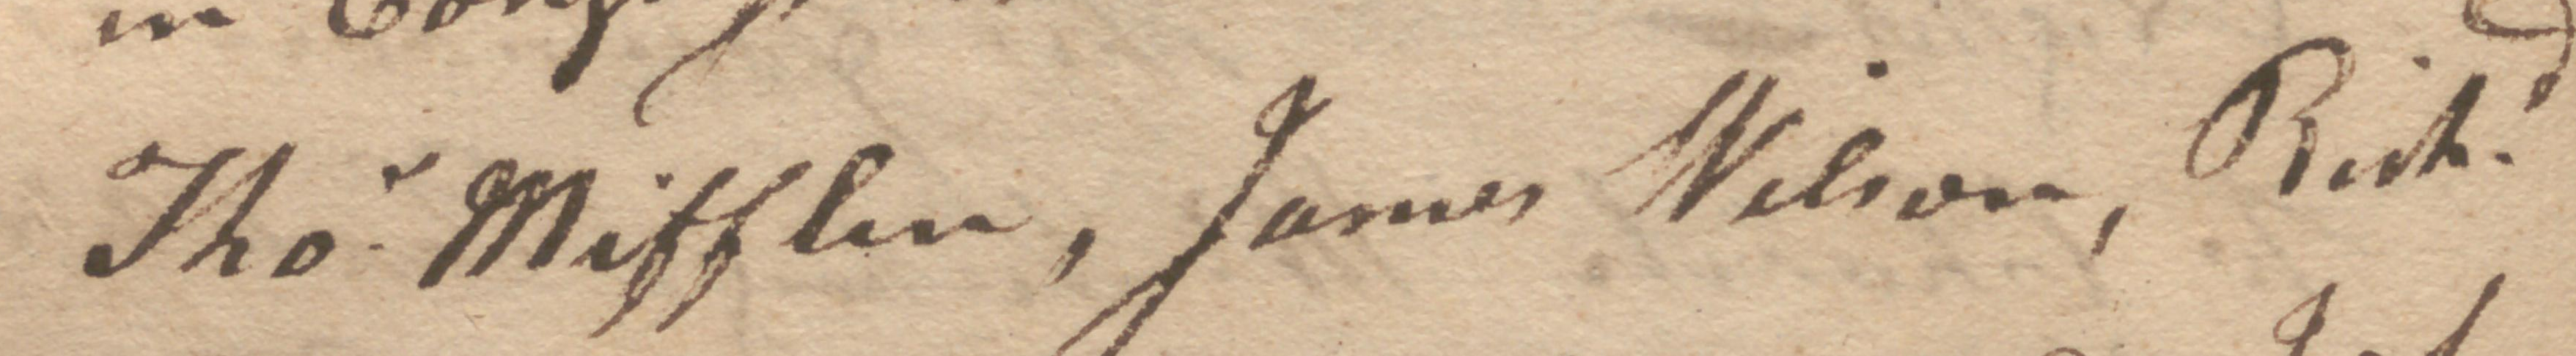Tho^s. Mifflin, James Wilson, Rich^d.
